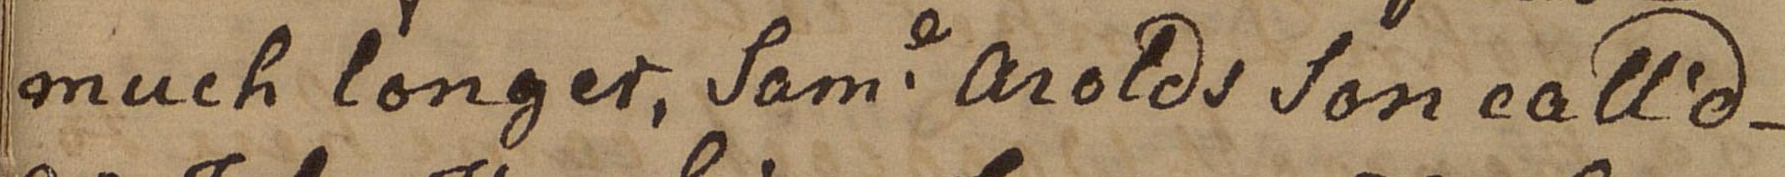much longer, Sam^I. Arolds Son call'd -
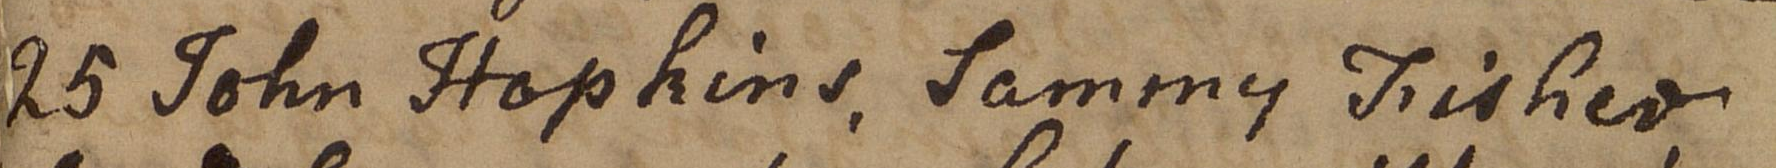25 John Hopkins, Sammy Fisher,
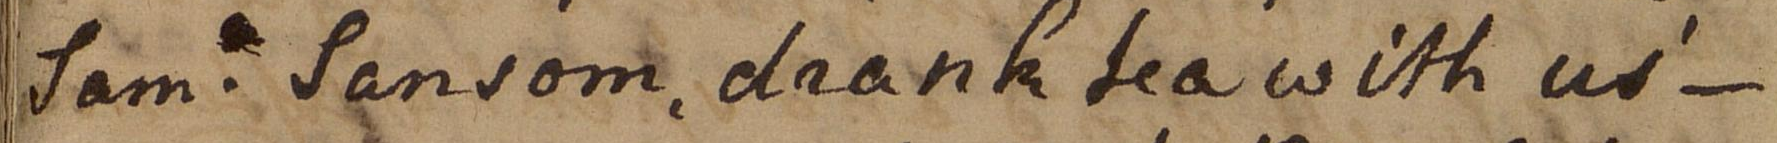Sam^l. Sansom, drank tea with us-
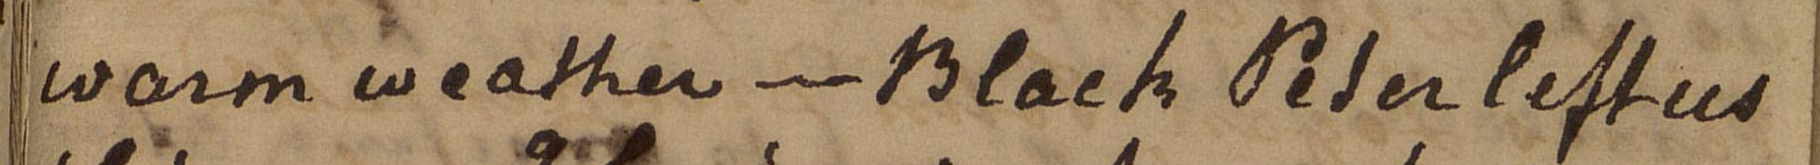warm weather- Black Peter left us
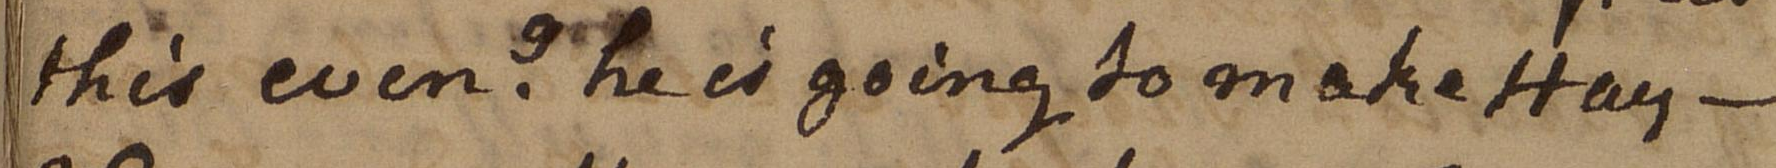this even^g. he is going to make Hay-
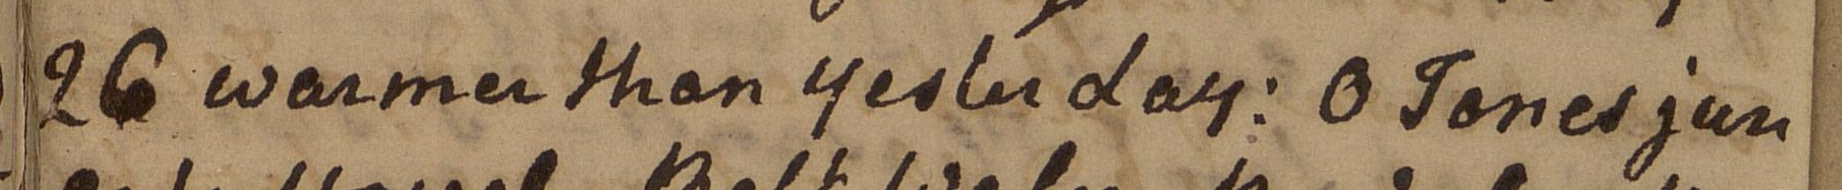26 warmer than yesterday: O Jones jun
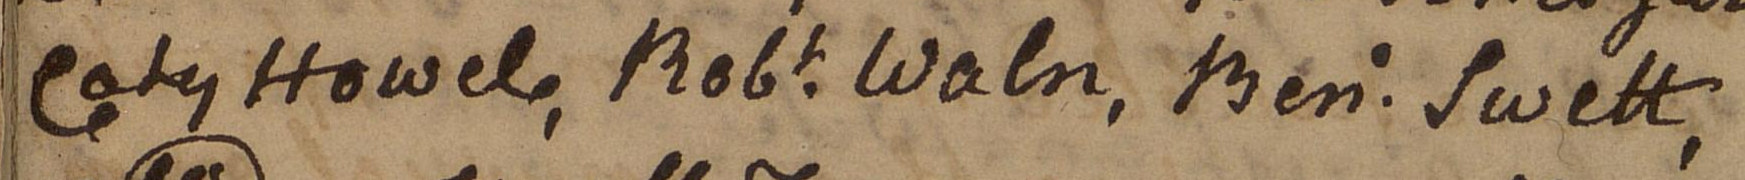Caty Howel, Rob^t. Waln, Ben^a. Swett,
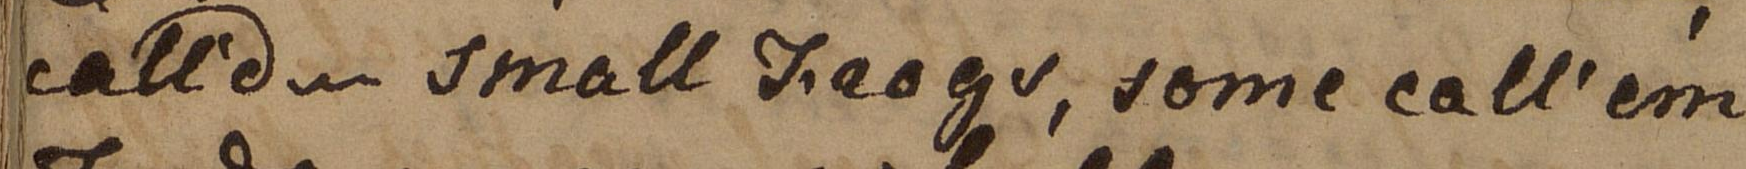call'd- small Frogs, some call 'em
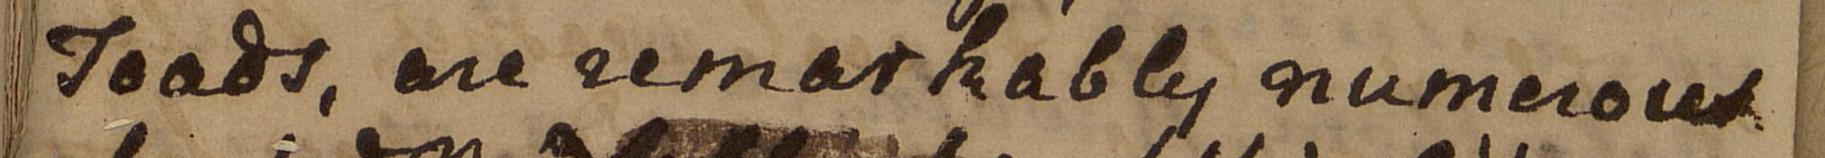Toads, are remarkably numerous
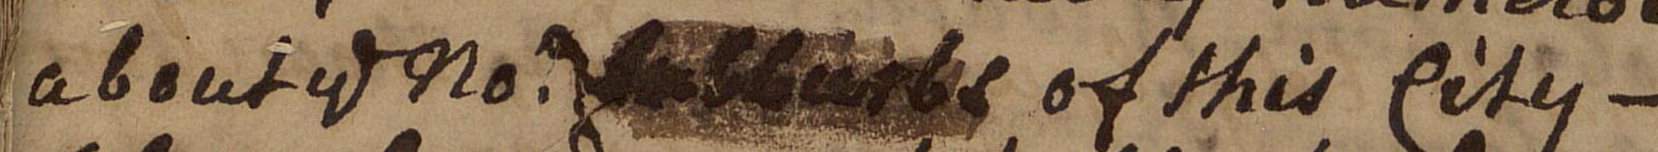about y^e No. Subburbs of this City-
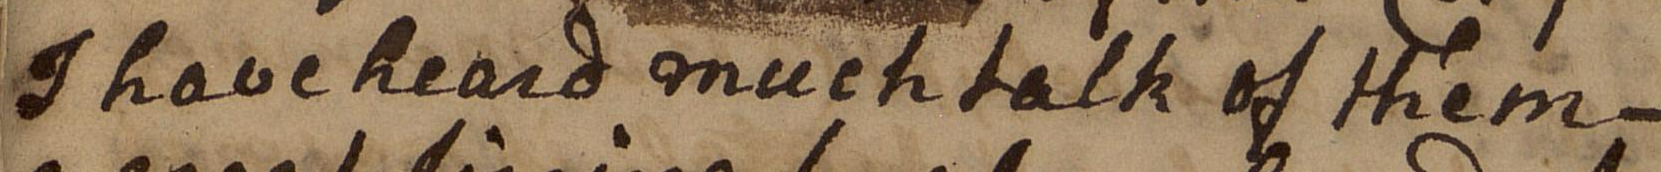I have heard much talk of them-
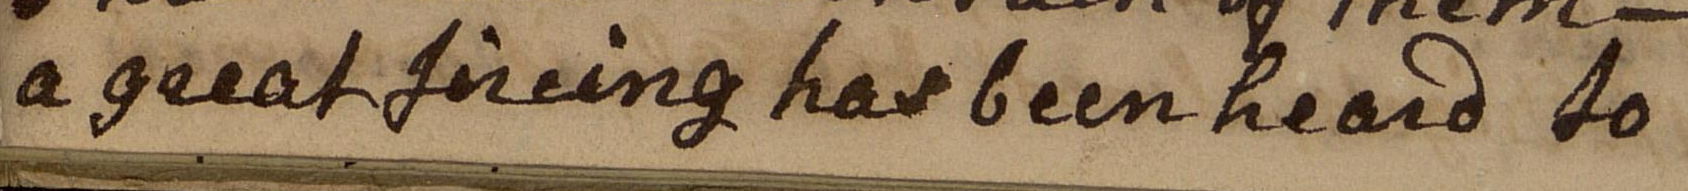a great fireing has been heard to
